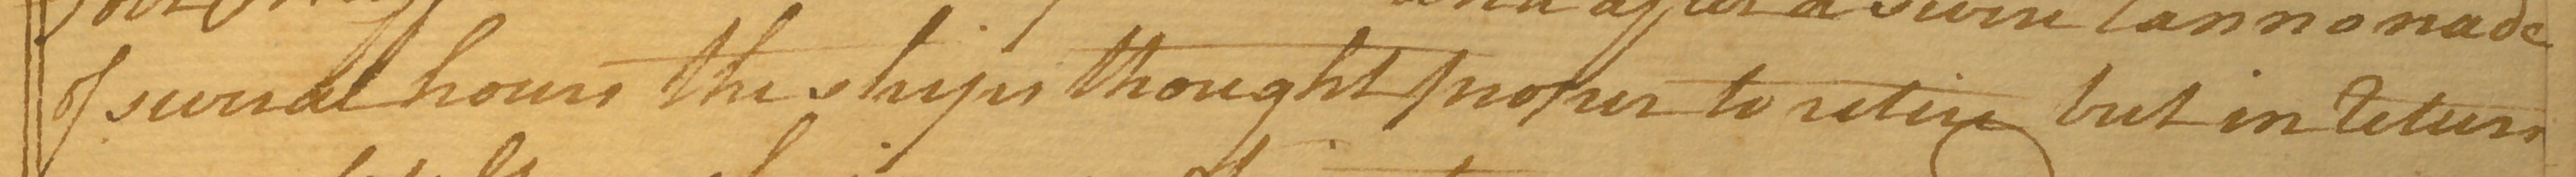of several hours the ships thought proper to retire but in return
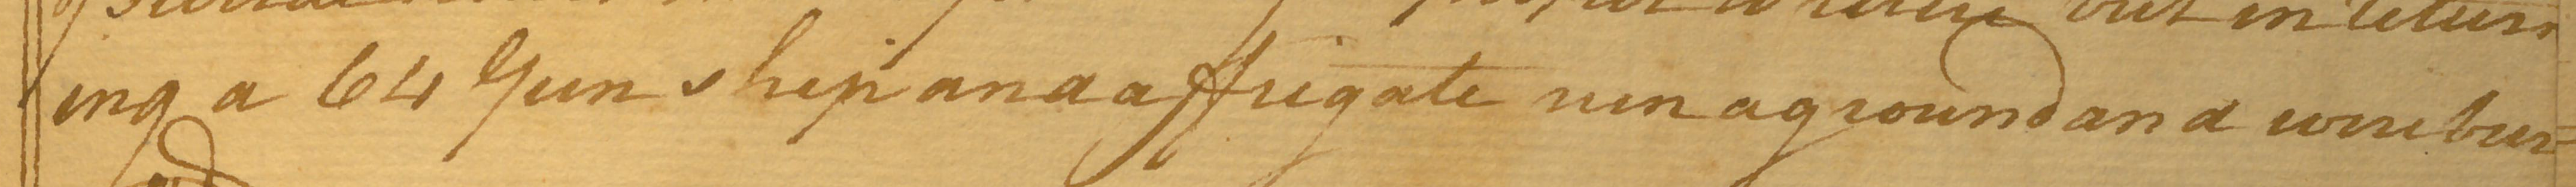ing a 64 Gun ship and a frigate run aground and were bur-
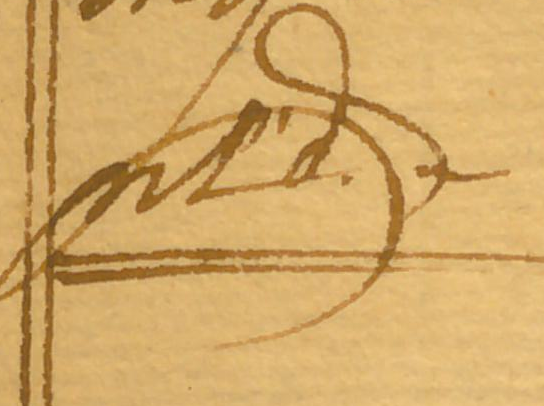nt'd.
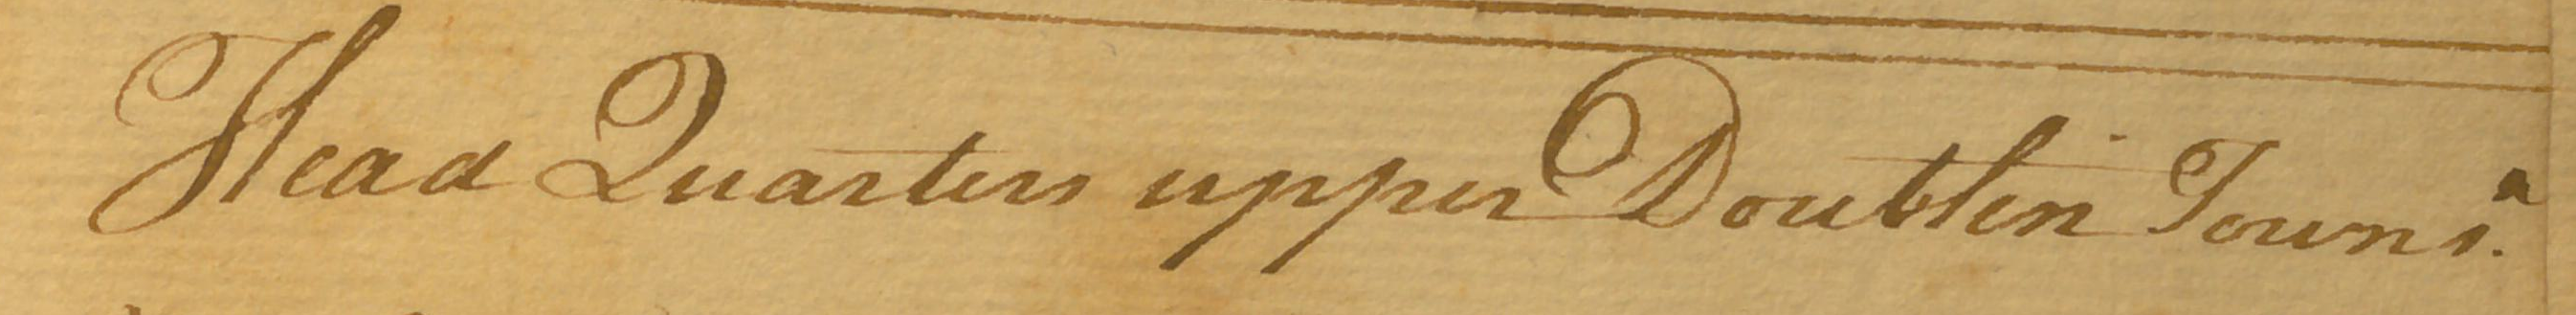Head Quarters upper Doublin Towns.
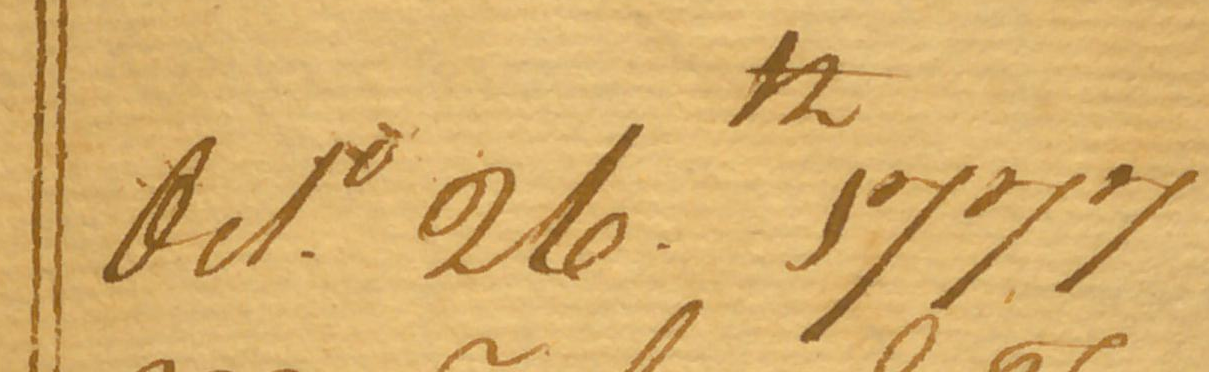Oct^r. 26^th. 1777
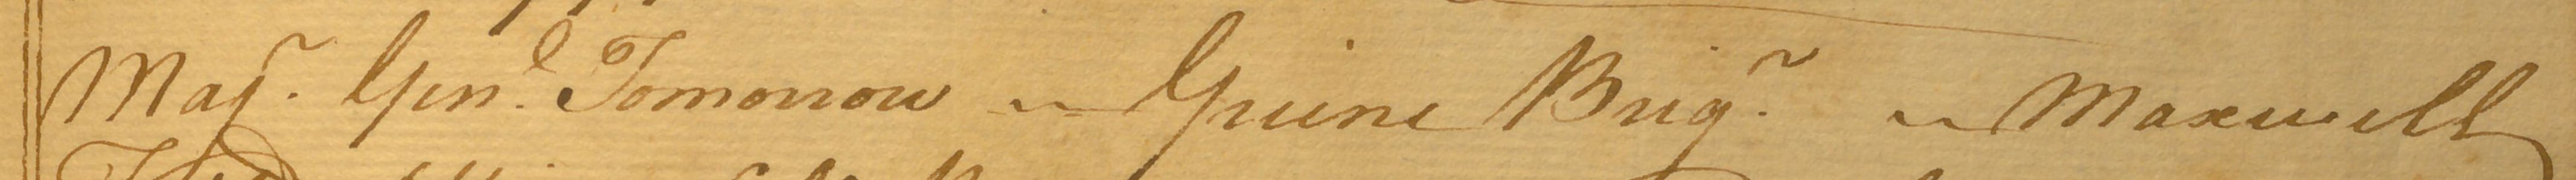Maj^r. Gen^l. Tomorrow- Greene Brig^r.- Maxwell
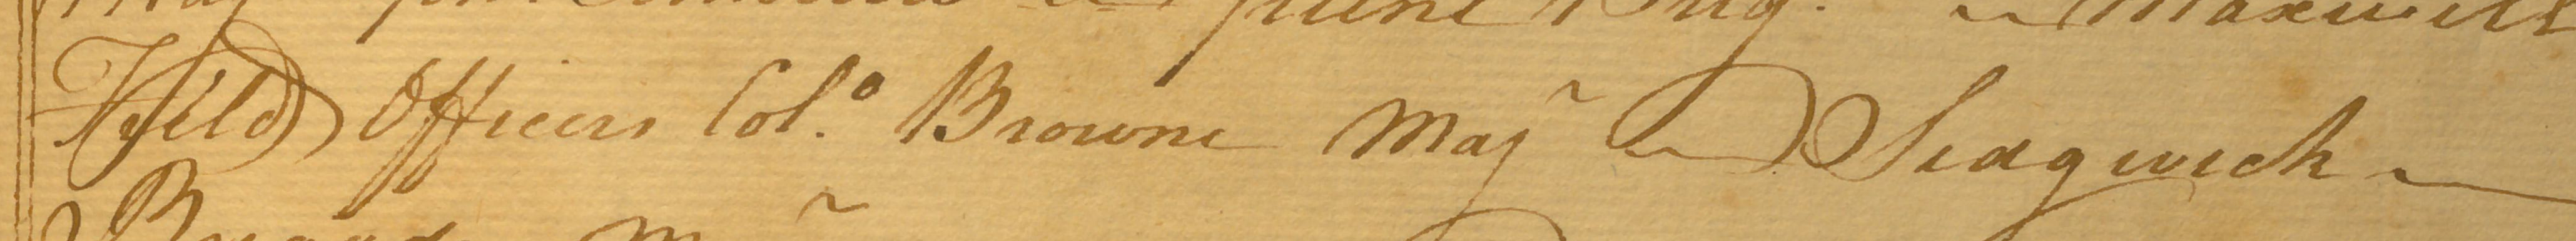Field Officers Col^o. Browne Maj^r Sedgwick-
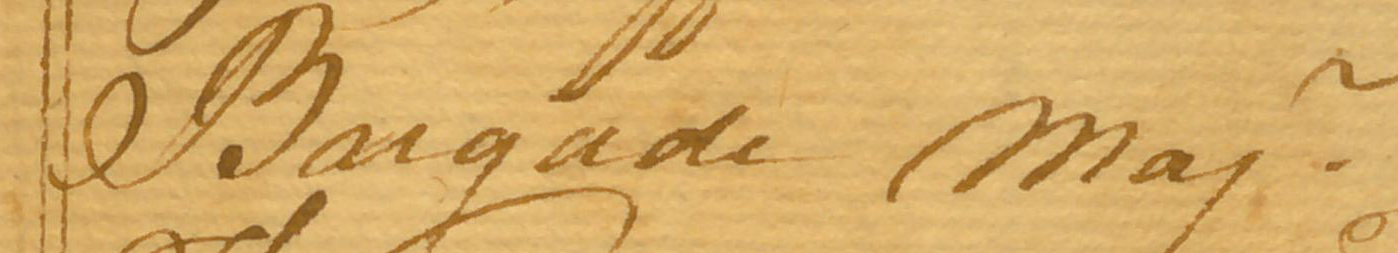Brigade Maj^r.
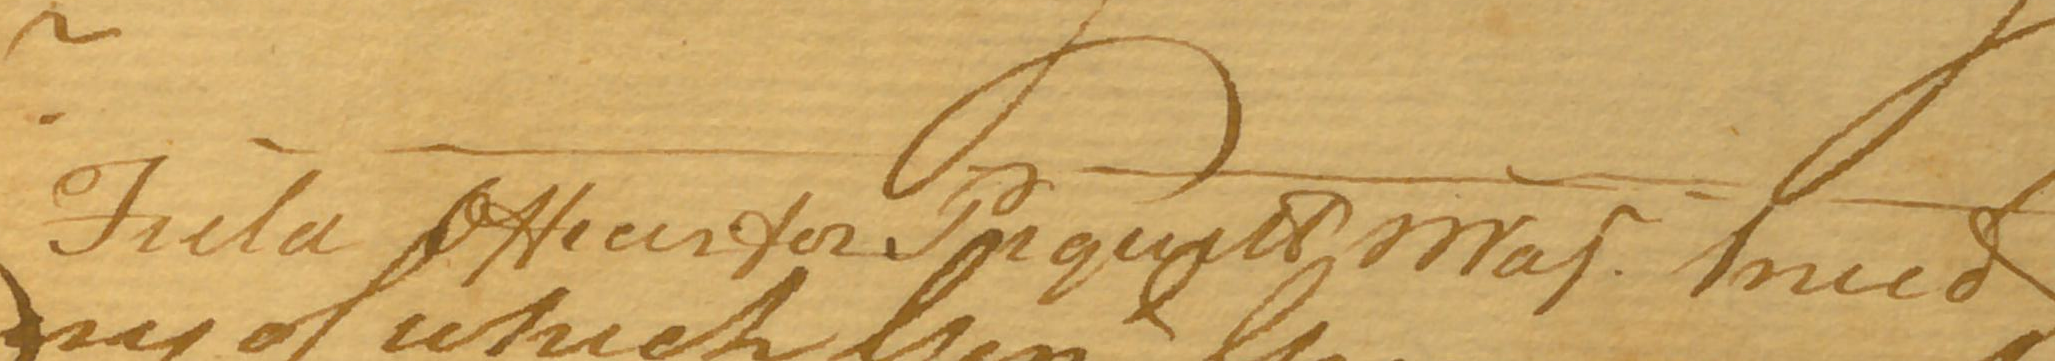Field Officer for Picquet Maj^r. Meed
